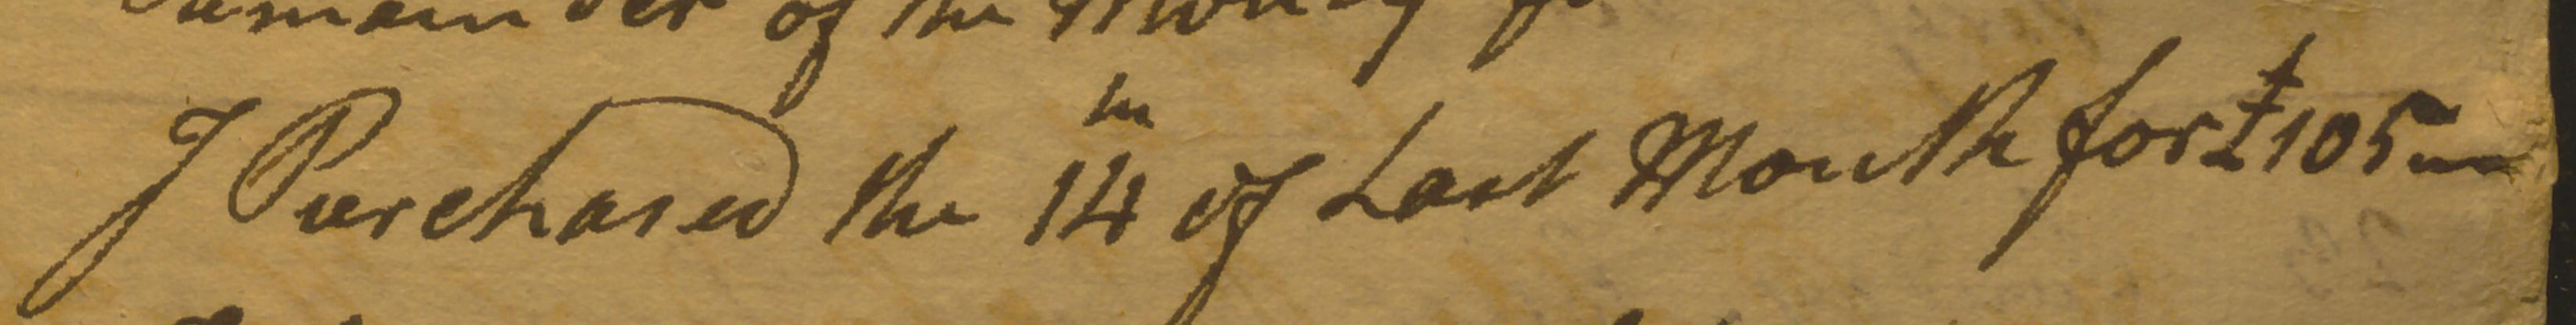I Purchased the 14^th of Last Month for £105.
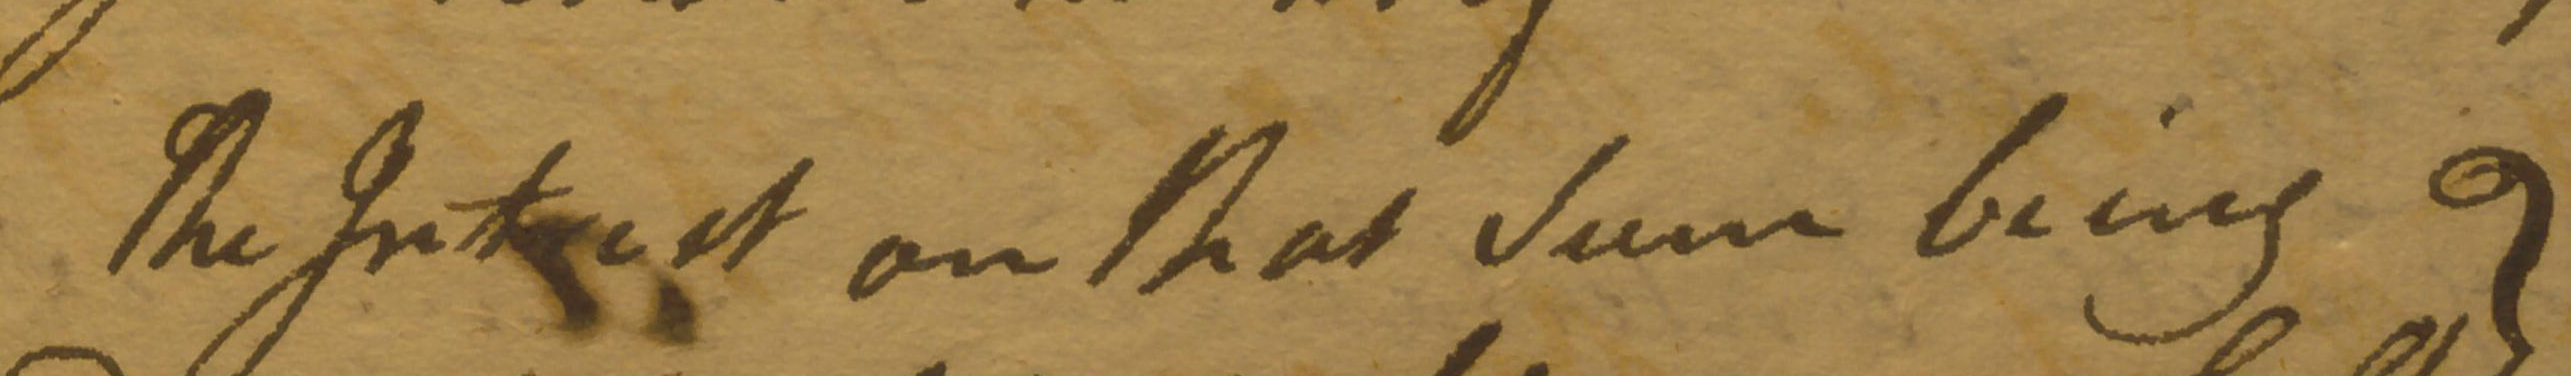The Intrest on that sum being
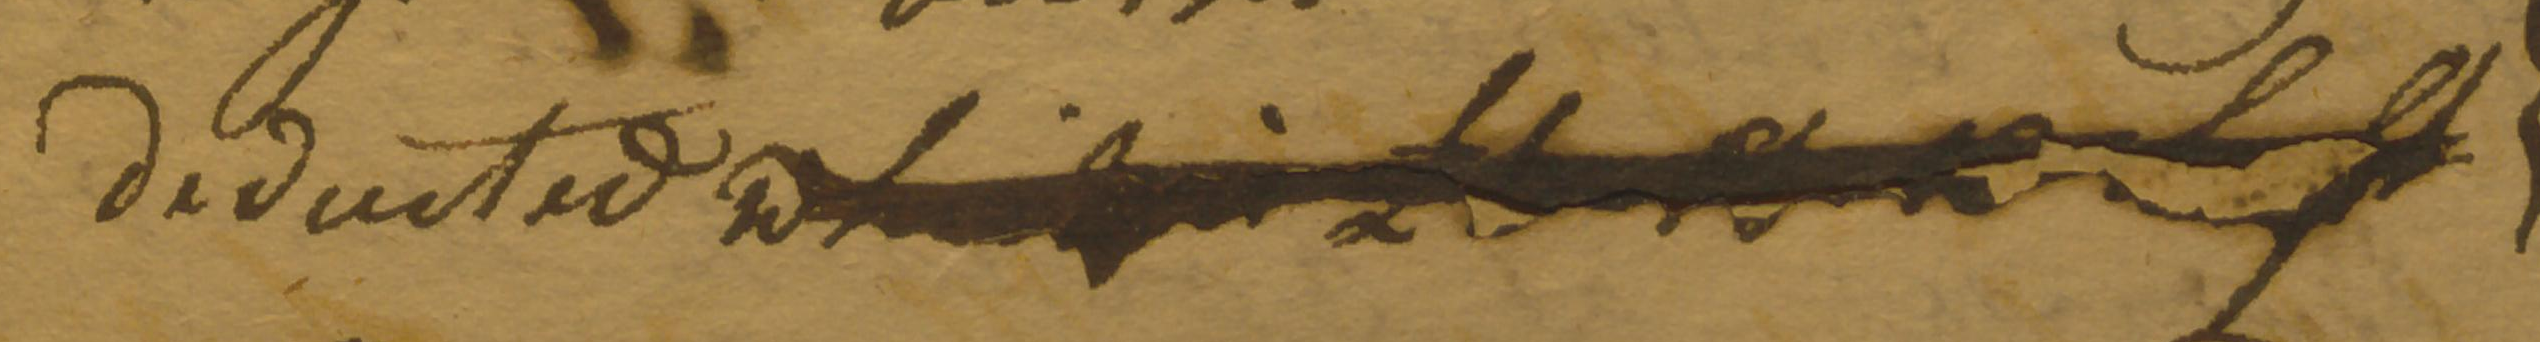deducted [_____________]
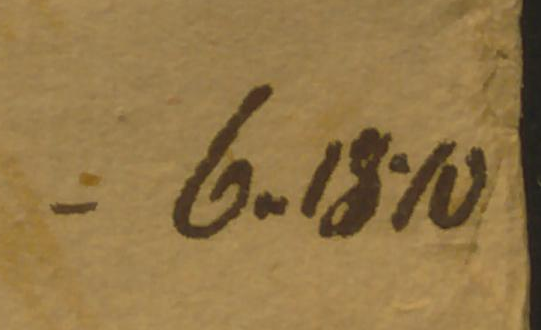6.18.10
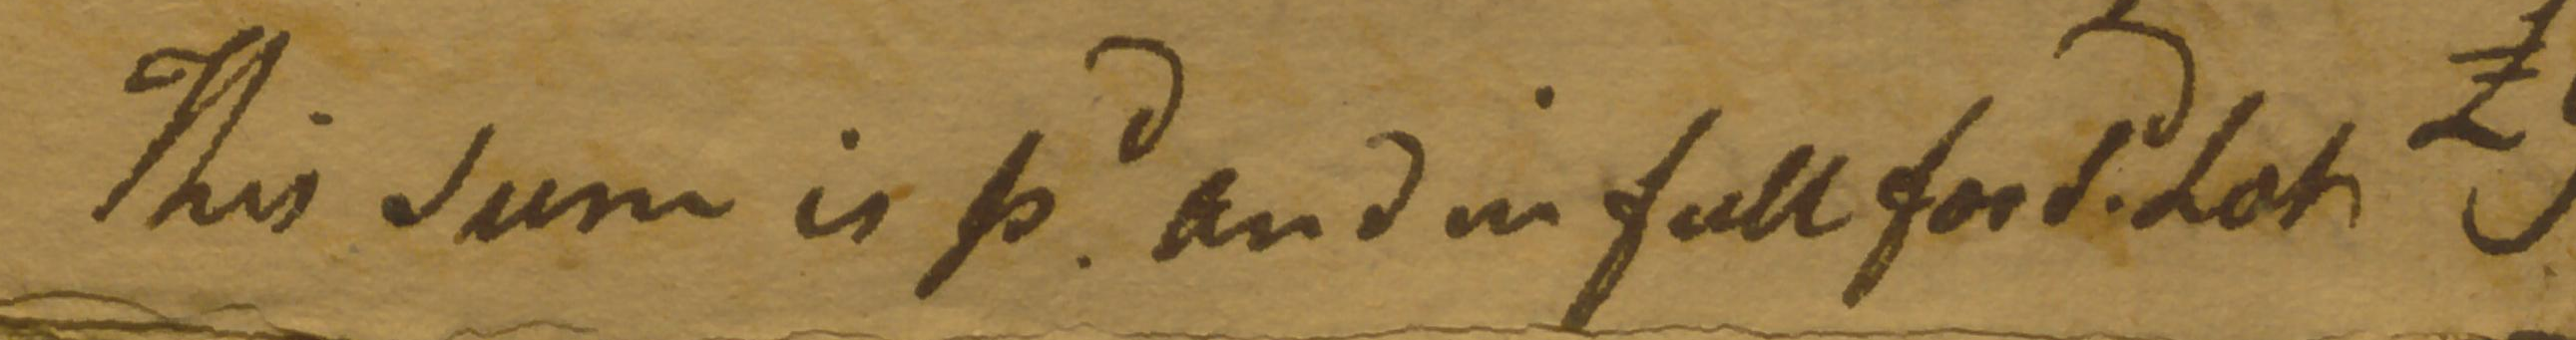This sum is p^d. and in full for s^d. Lot
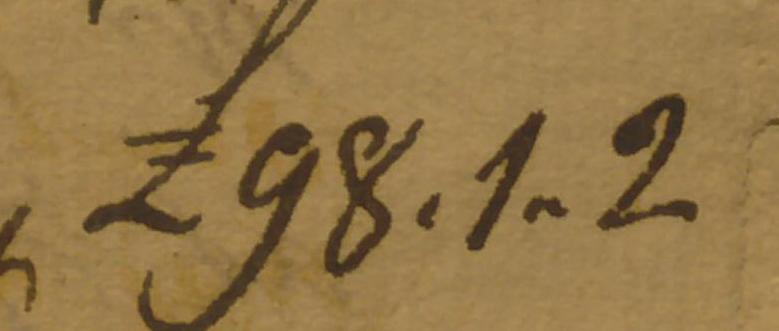£98.1.2
